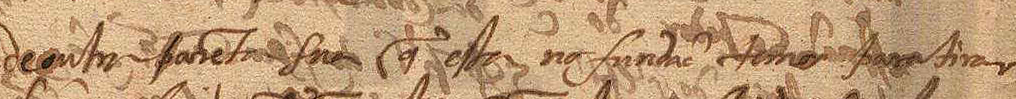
de outra parēta sua q̄ esta no fundaõ temos para tirar
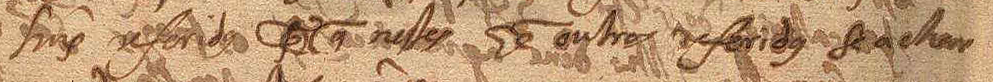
hūs referidꝯ p̄oq̄ nestes E ē outros referidos se achar
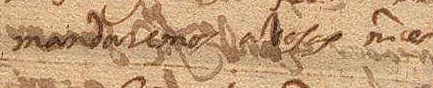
mandaremos a vosas m̄ces
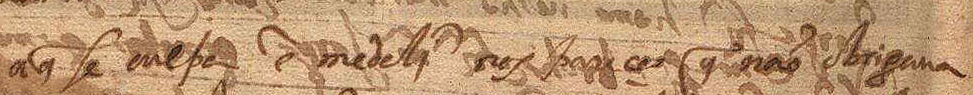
a q̄ se culpa ē medelj̄ nos pareceo q̄ naõ obrigaua
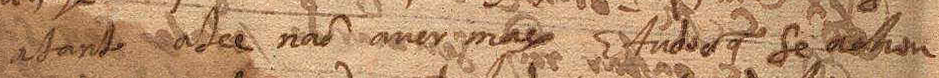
a tanto atee naõ auer maes E tudo o q̄ se achou
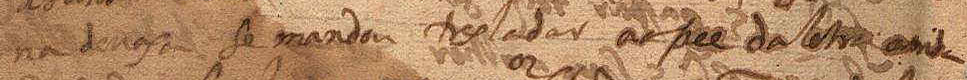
na deuasa se mandou tresladar ao pee da letra ainda
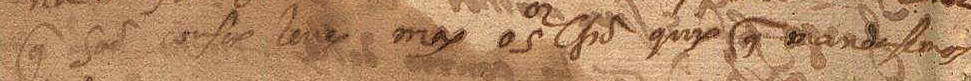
q̄ saõ cousas leues mas o sor bpō quis q̄ mandasemos
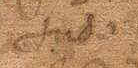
tudo
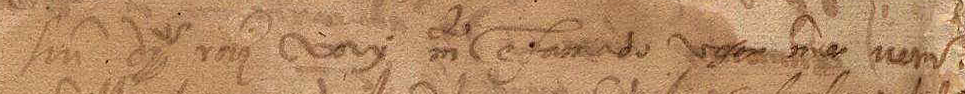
hū dos roiz̄ vay mto ēfamado vosas m̄ces uerā
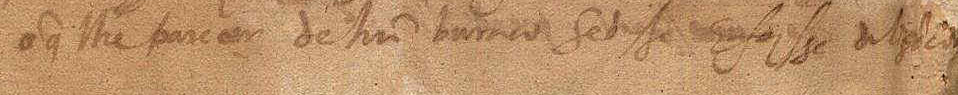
o q̄ lhe parecer de hū buraco se disse E fez sse deligēcia
